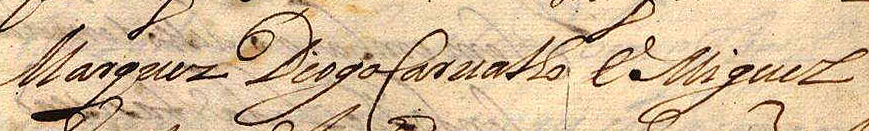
Marquez Diogo Carualho, e Miguel
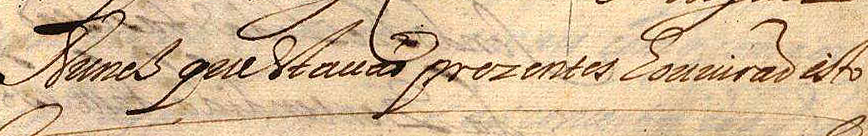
Nunez que estauaõ prezentes E ouuirão isto
